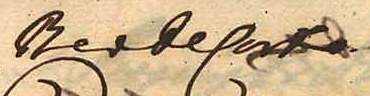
Reo de Certo
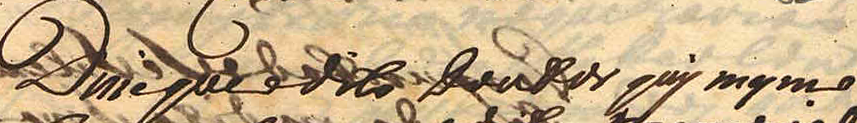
Disse que o dito Doutor quis mesmo
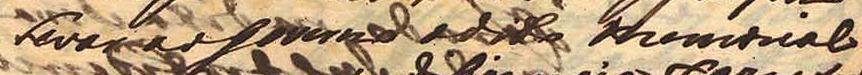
levar ao Governo o dito Memorial
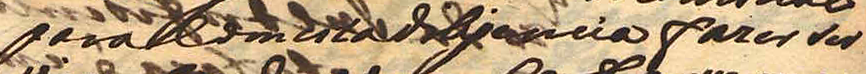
para com esta diligencia fazer ser
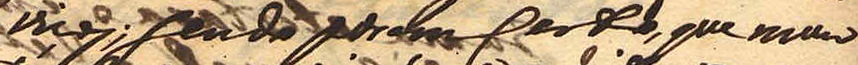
viços; sendo porem Certo, que mun
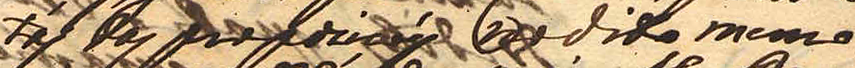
tas das propoziçoẽs no dito memo
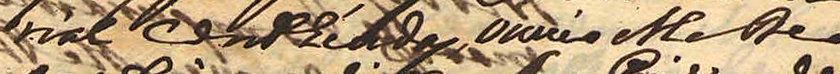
rial contheudas, ouuio elle Reo
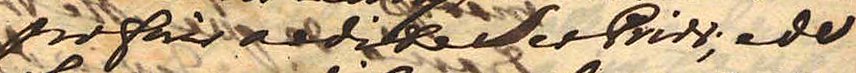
proferir ao ditto Seo Prior; e de
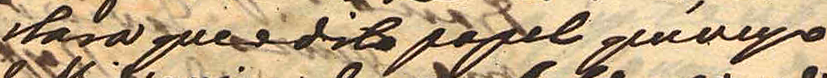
clara que o dito papel que veyo
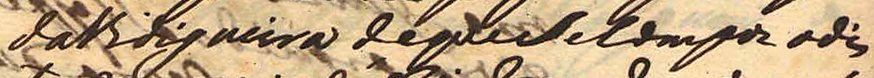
da Vidigueira de que Se compoz o di
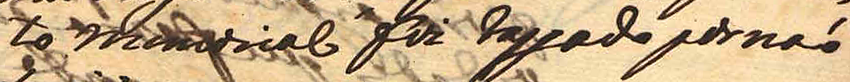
to memorial foi rasgado por naõ
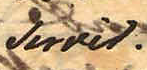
servir.
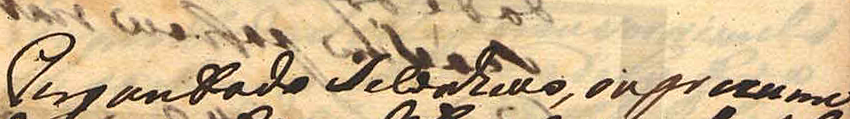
Perguntado se conheceo, ou prezume
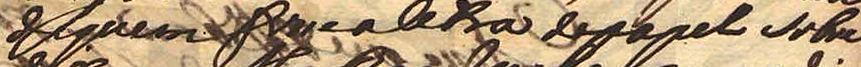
de quem fosse a letra do papel sobre
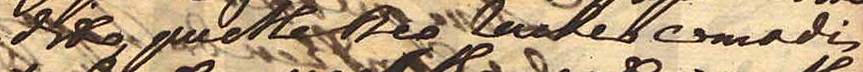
dito, que elle Reo Recebeo com a di
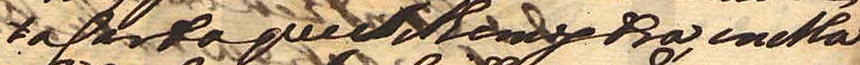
ta Carta que Se lhe mostra, e nella
